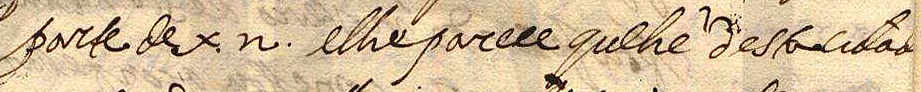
parte de x. n. e lhe parece que he desta cidad
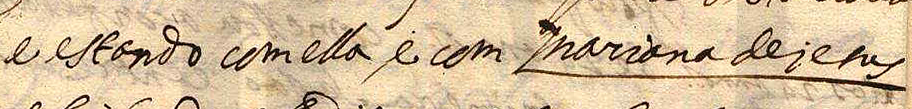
e estando com ella, e com mariana de jesus
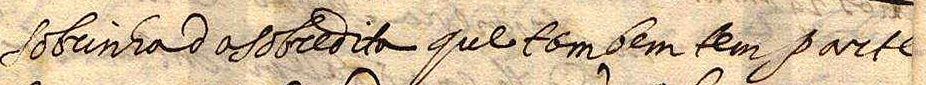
sobrinha da sobredita que tambem tem parte
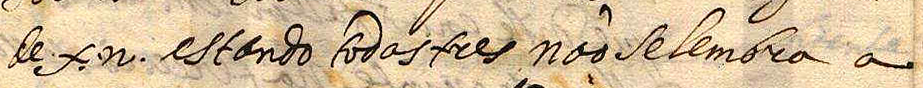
de x. n. estando todas tres naõ se lembra a
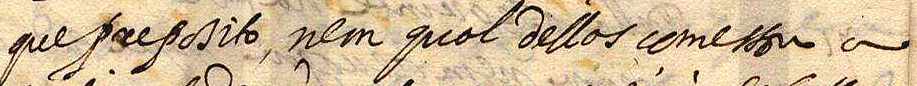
que preposito, nem qual dellas comessou a
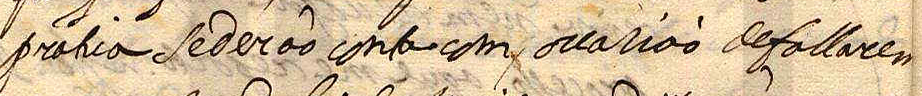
pratica se deraõ conta com occaziaõ de fallarem
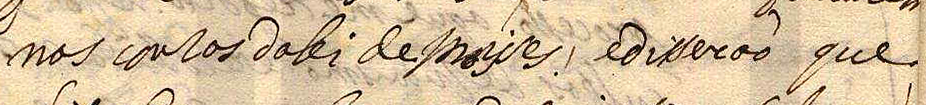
nas couzas da lei de moyses, e disseraõ que
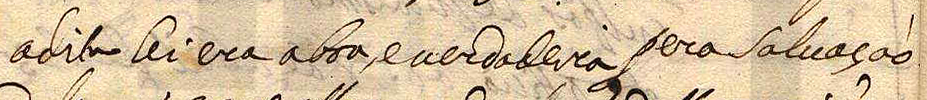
a dita lei era a boa, e uerdadeira pera saluaçaõ
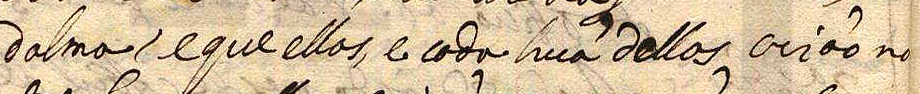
dalma / e que ellas, e cada huā dellas criaõ na
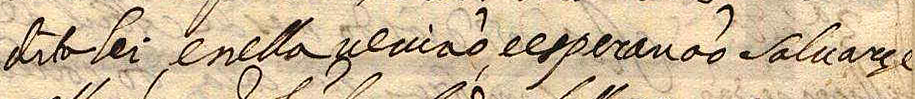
dita lei e nella ueuiaõ, e esperauaõ saluarse
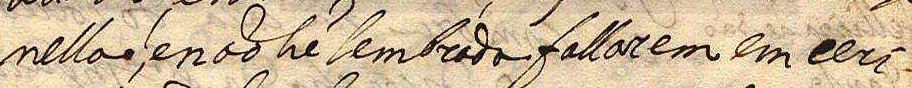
nella, e naõ he lembrada fallarem em ceri
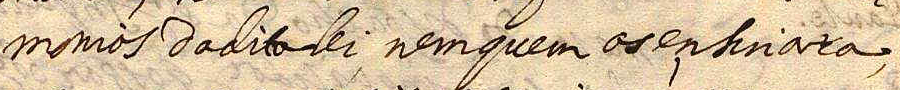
monias da dita lei nem quem as ensinara,
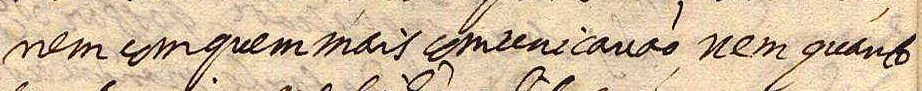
nem com quem mais comunicauaõ, nem quanto
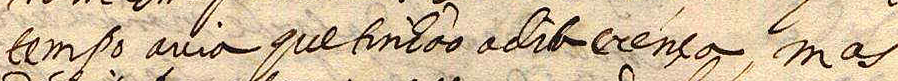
tempo auia que tinhão a dita crença, mas
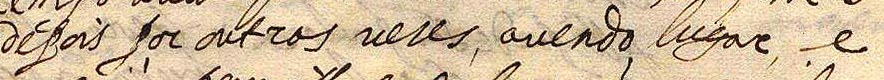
depois por outras uezes, auendo lugar, e
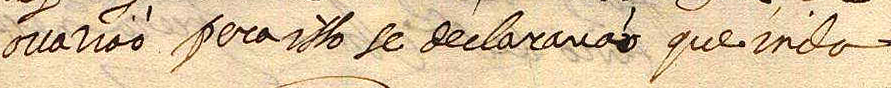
occaziaõ pera isso se declarauaõ que inda
